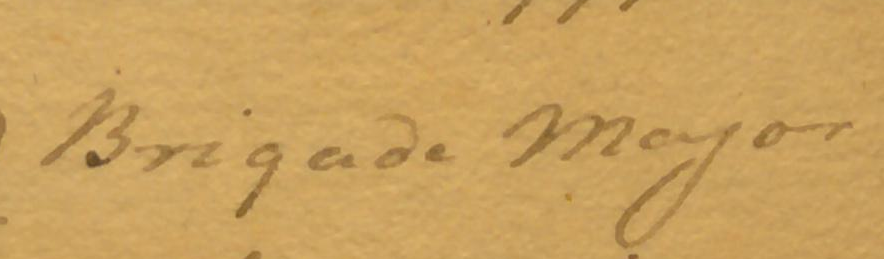Brigade Major
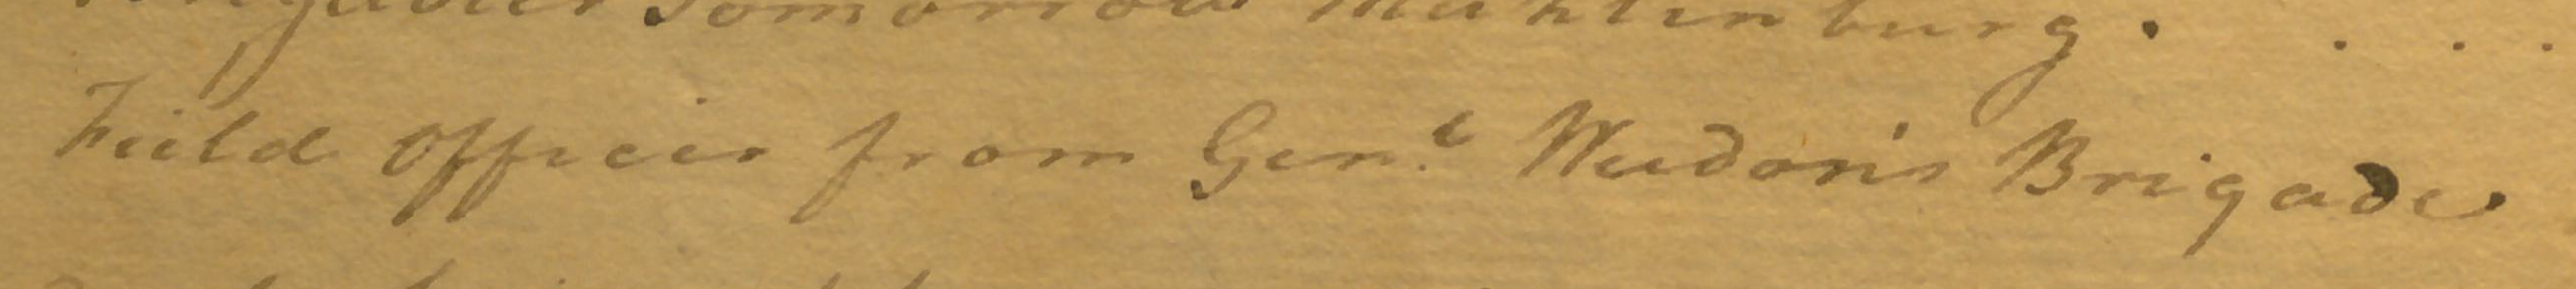Field officer from Gen^l. Weedon's Brigade
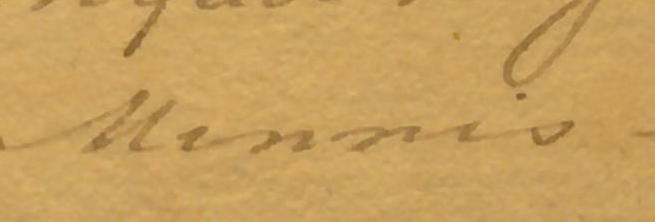Minnis
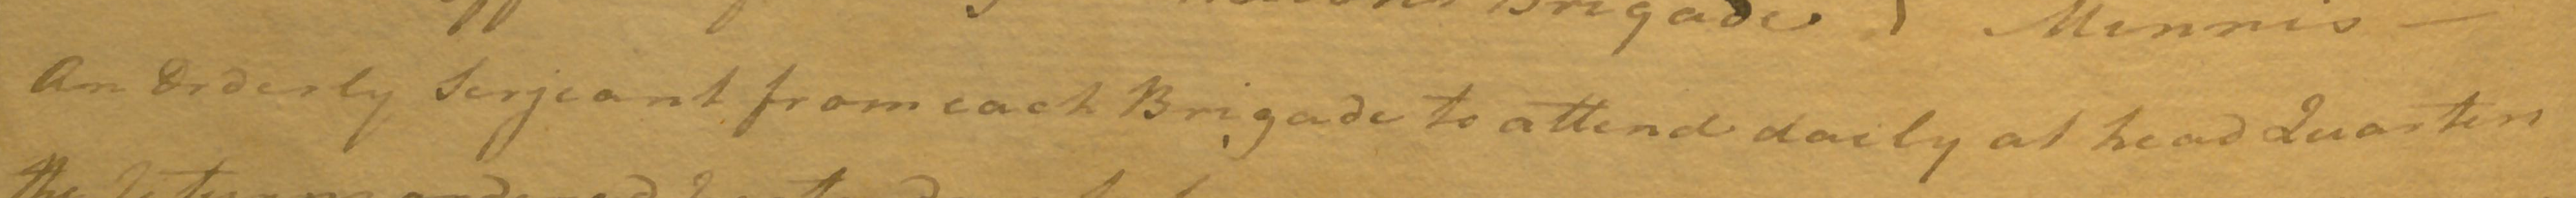An Orderly Serjeant from each Brigade is to attend daily at head Quarters
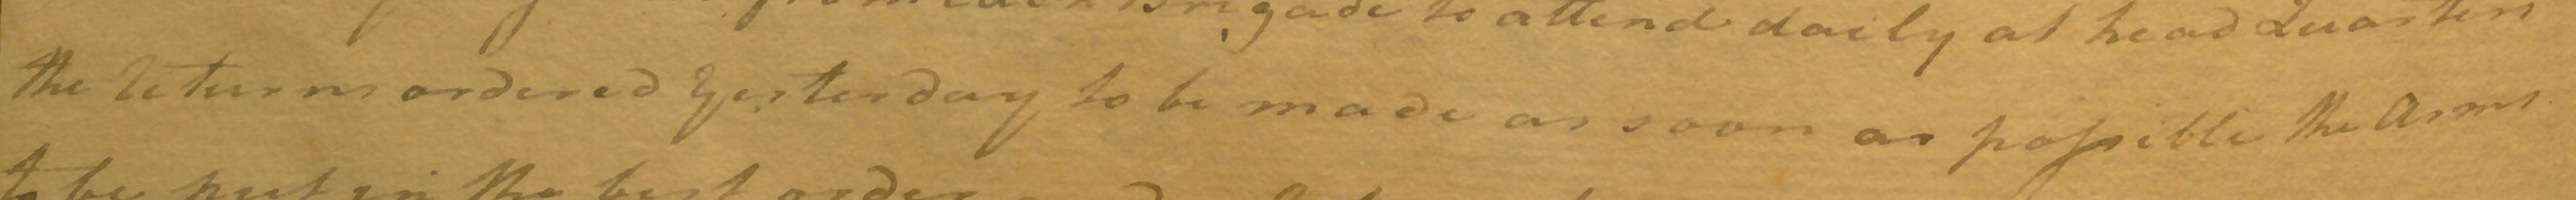the returns ordered yesterday to be made as soon as possible the Arms
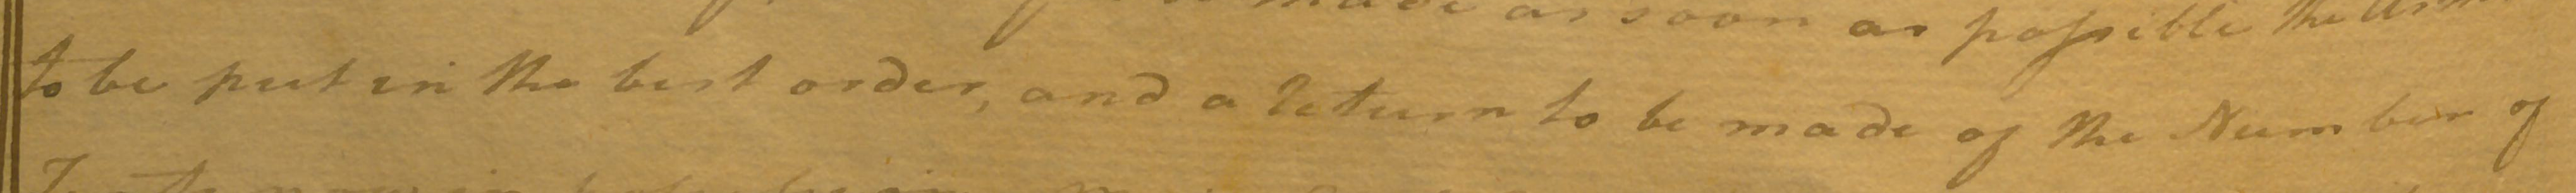to be put in the best order, and a return to be made of the Number of
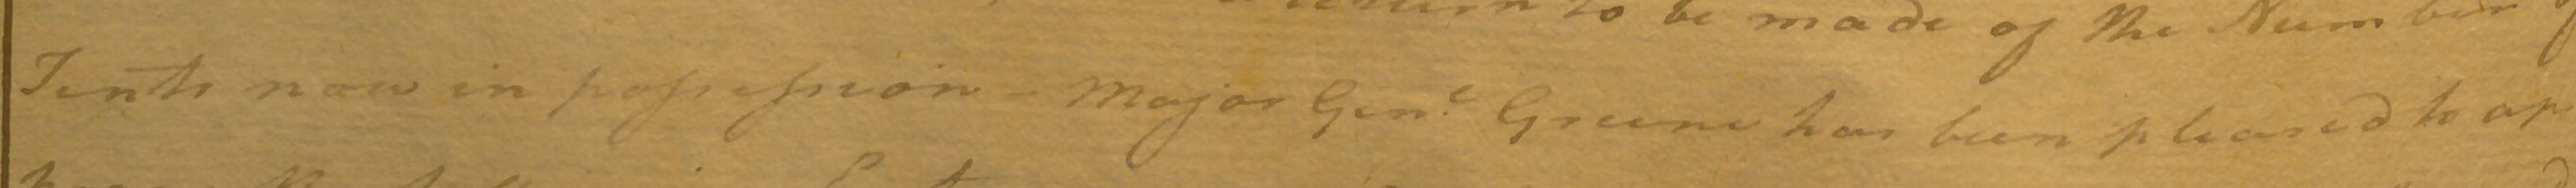Tents now in possession. Major Gen^l. Greene has been pleased to be ap
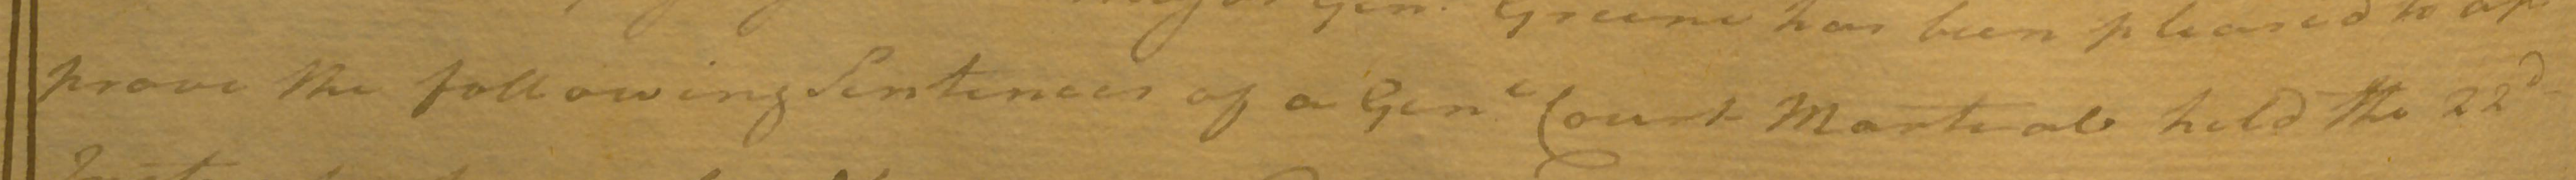prove the following Sentences of a Gen^l Court Martial held the 22^d
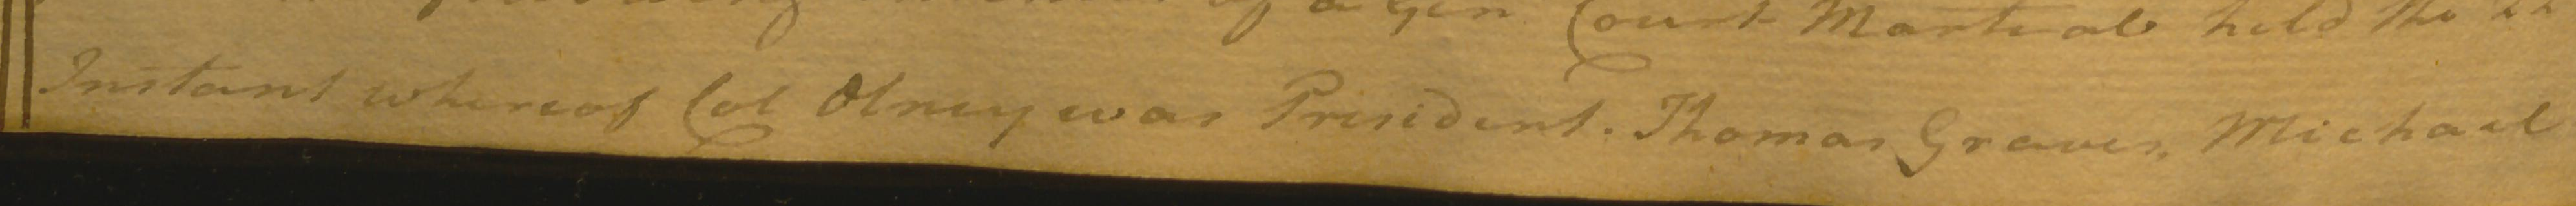Instant whereof Col Olney was President. Thomas Graves, Michael
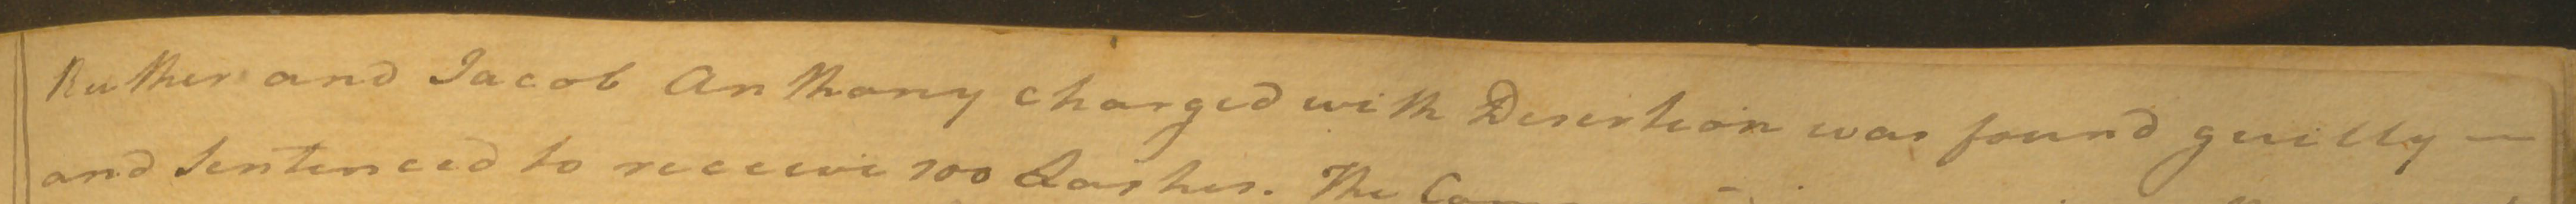Ruthers and Jacob Anthony charged with Desertion was found guilty-
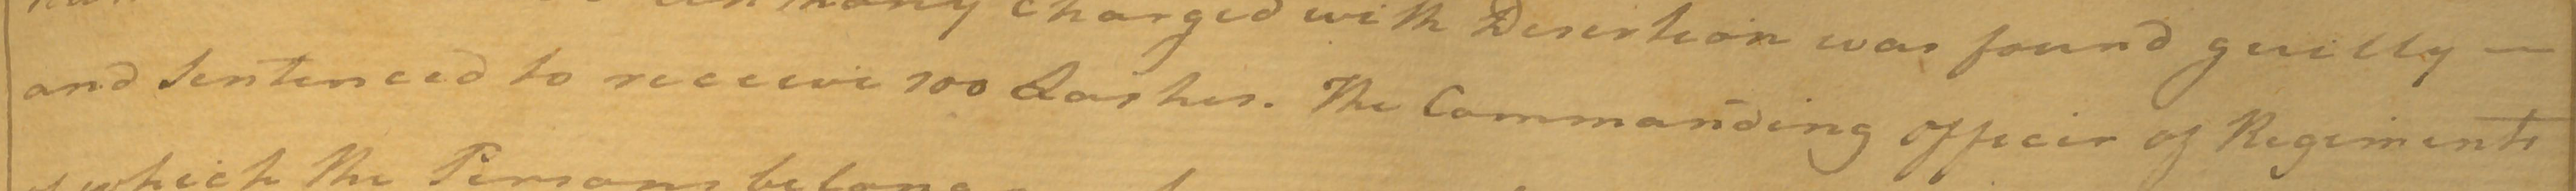and Sentenced to receive 100 Lashes. The Commanding officer of Regiments
